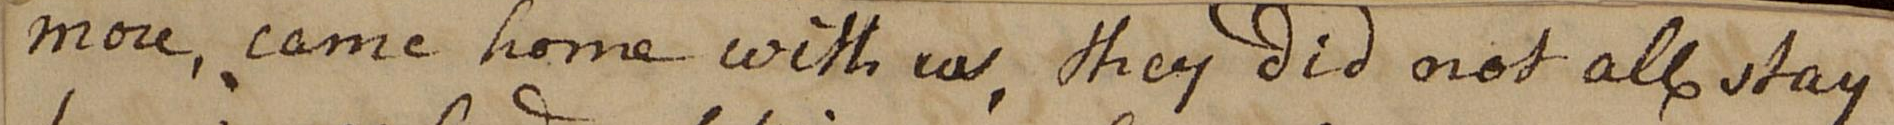more, came home with us, they did not all stay
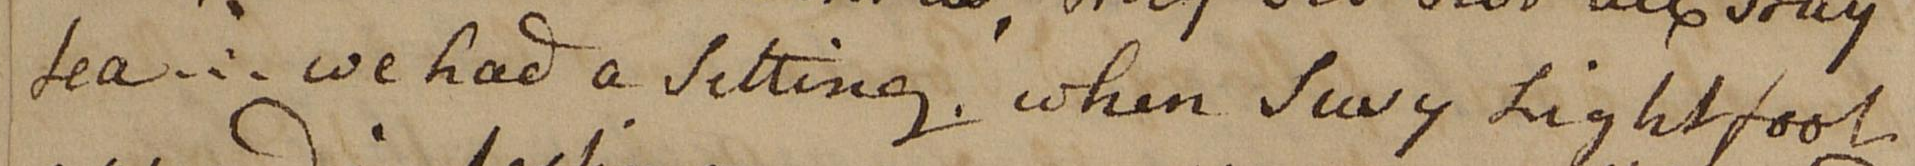tea--- we had a Sitting. when Susy Lightfoot
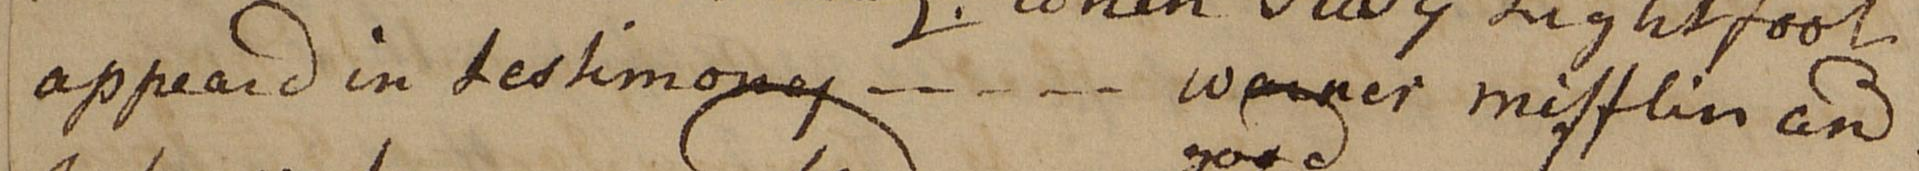appeard in testimony----- Warner Mifflin and
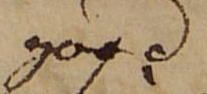good
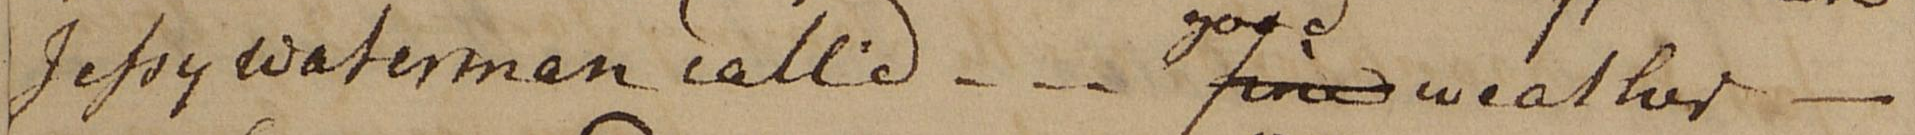Jessy Watermen call'd--- [fine] weather-
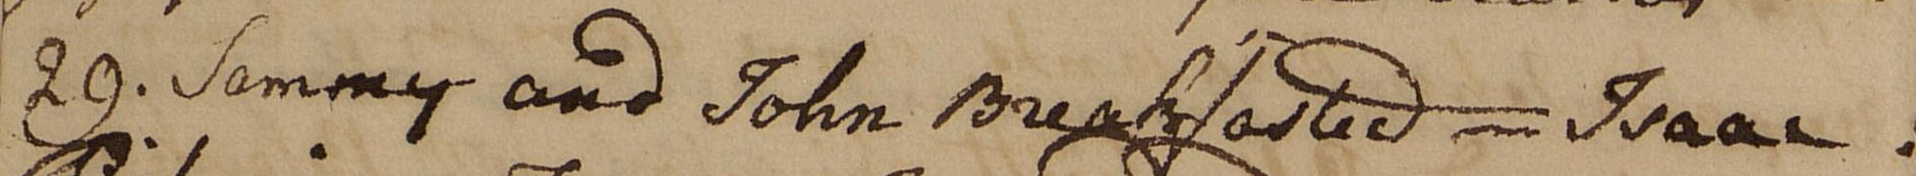29. Sammy and John Breakfasted- Isaac
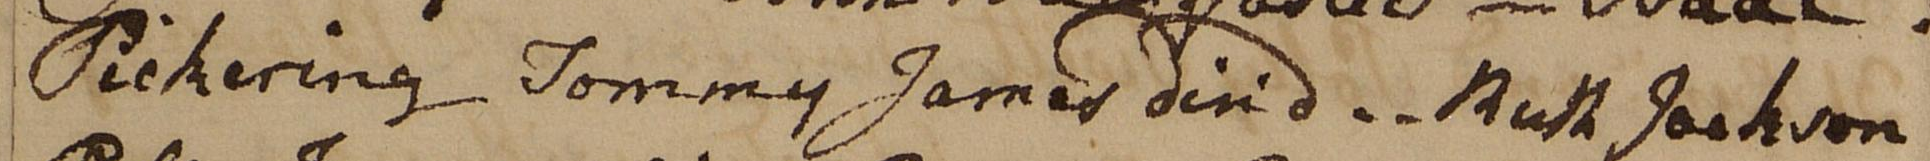Pickering Tommy James din'd- Ruth Jackson,
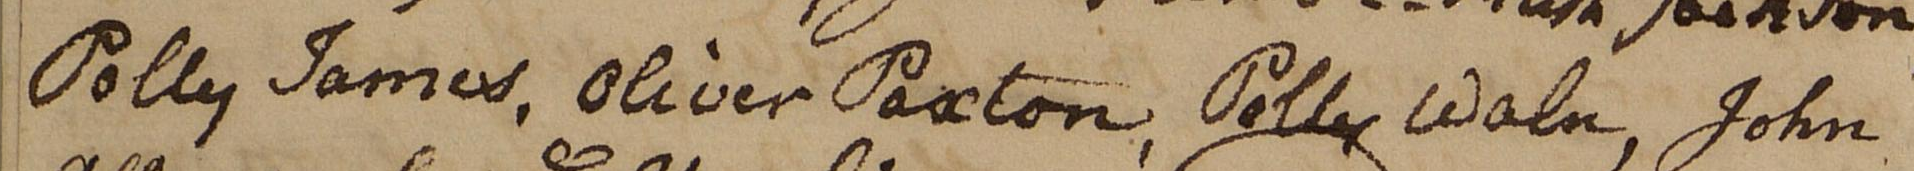Polly James, Oliver Paxton, Polly Waln, John
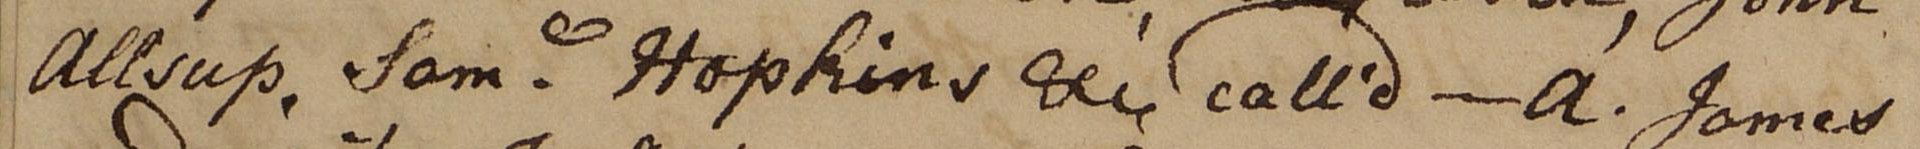Allsup, Sam^l. Hopkins &c call'd- A. James
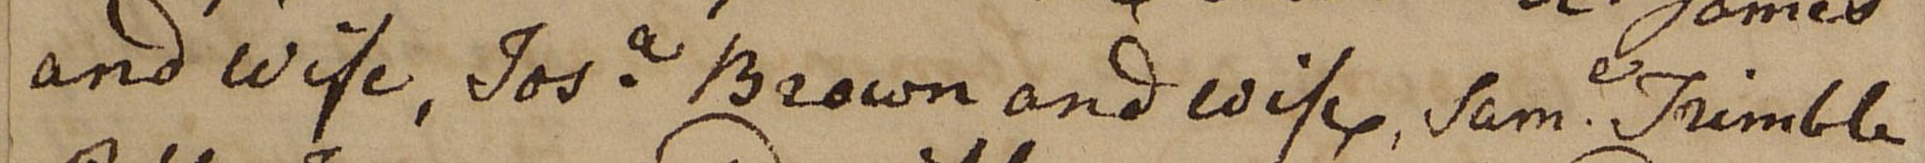and Wife, Jos^a. Brown and Wife, Sam^l. Trimble
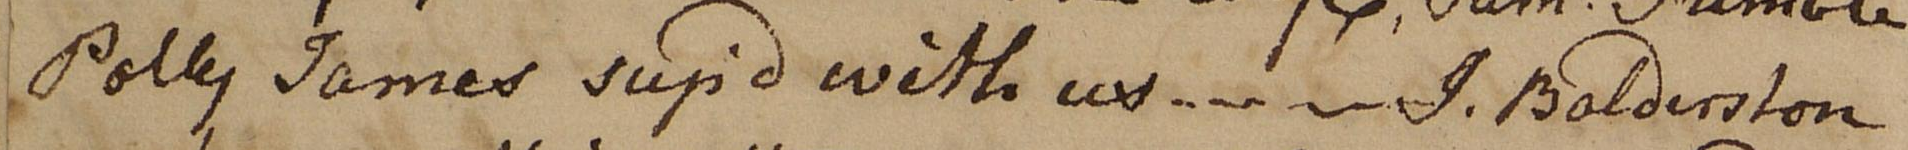Polly James sup'd with us--- I. Balderston
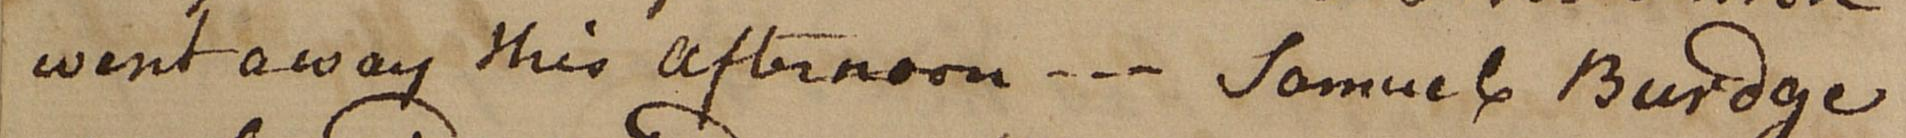went away this Afternoon--- Samuel Burdge
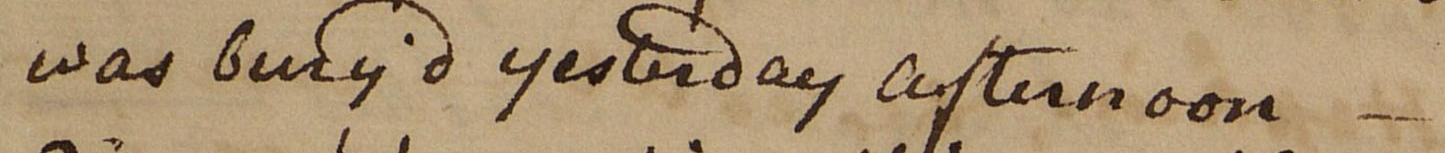was bury'd yesterday afternoon-
